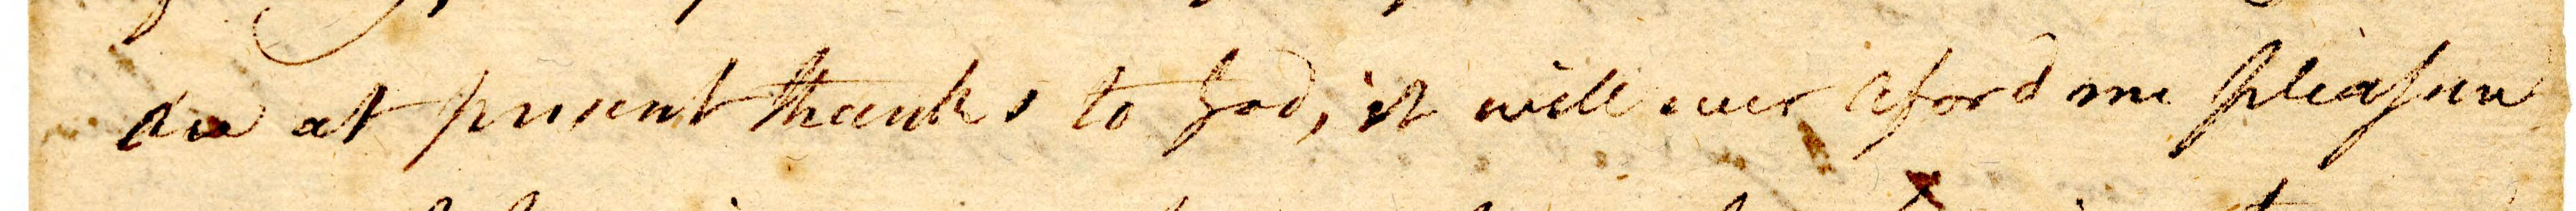are at present thanks to god, it will ever aford me pleasure
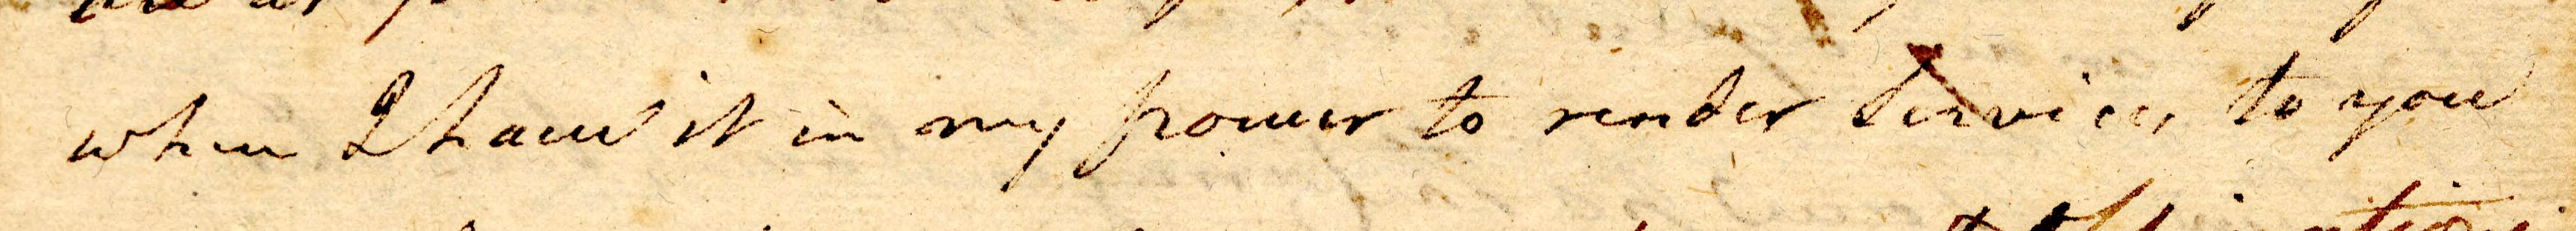when I have it in my power to render Service to you
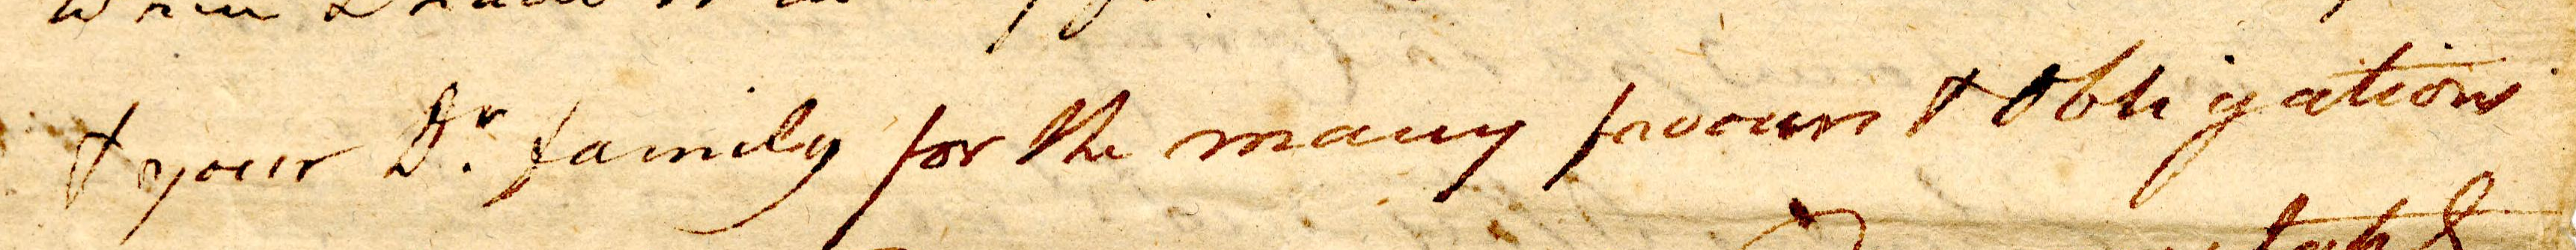& your D^r. family for the many favors & obligations
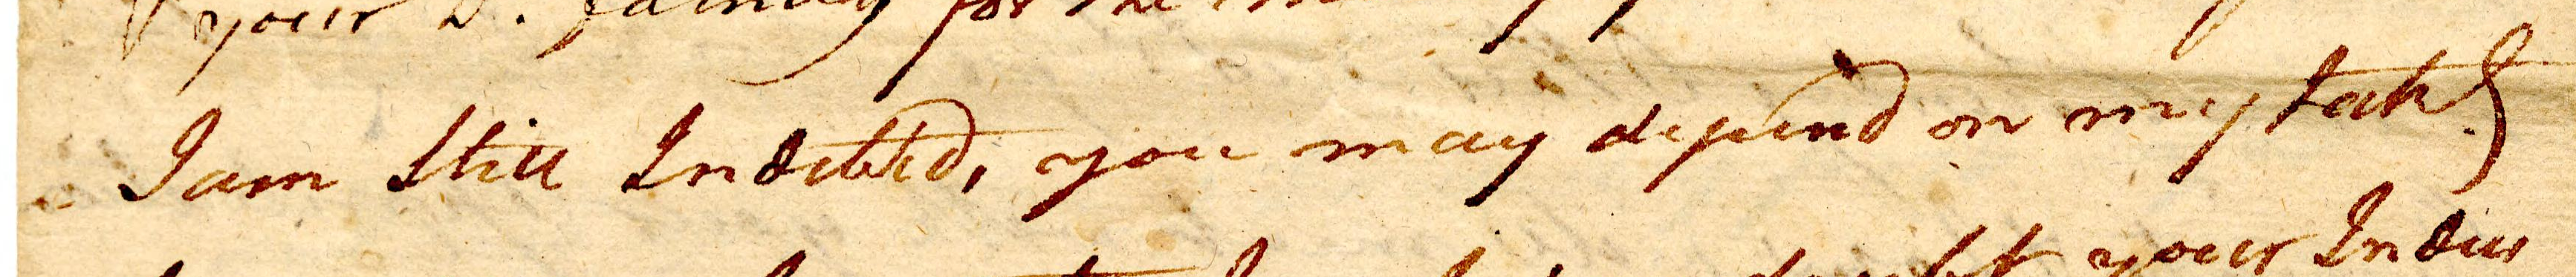I am Still Indebted, you may depend on my tak^g.
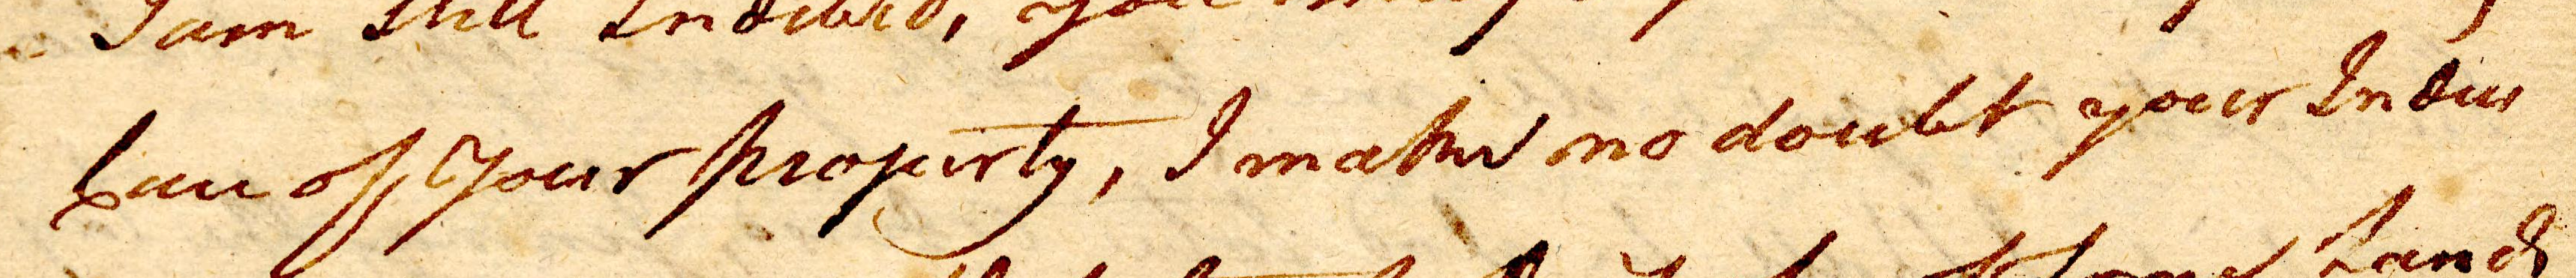have of your property, I make no doubt your Indus-
